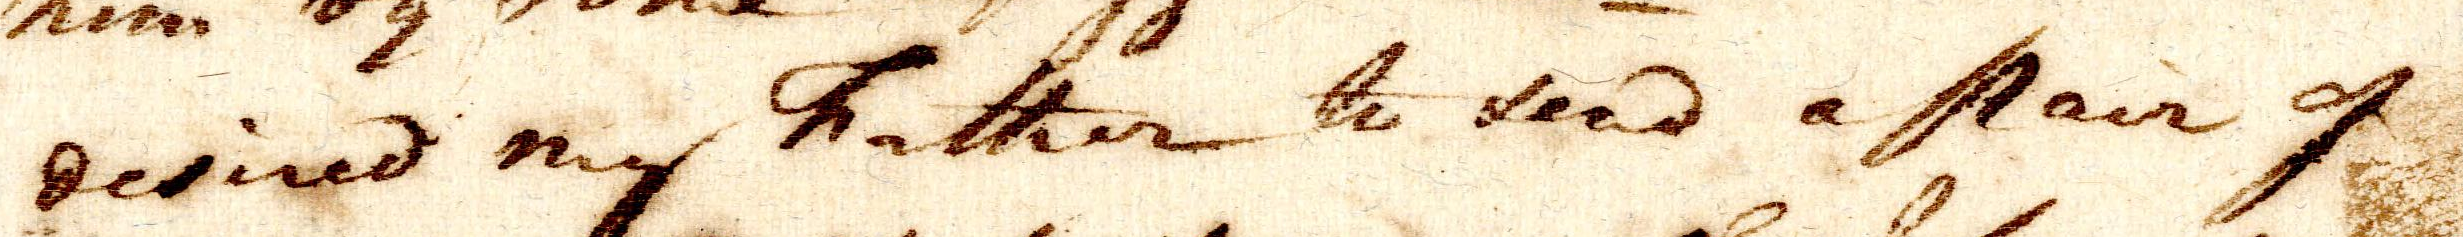desired my Father to send a pair of
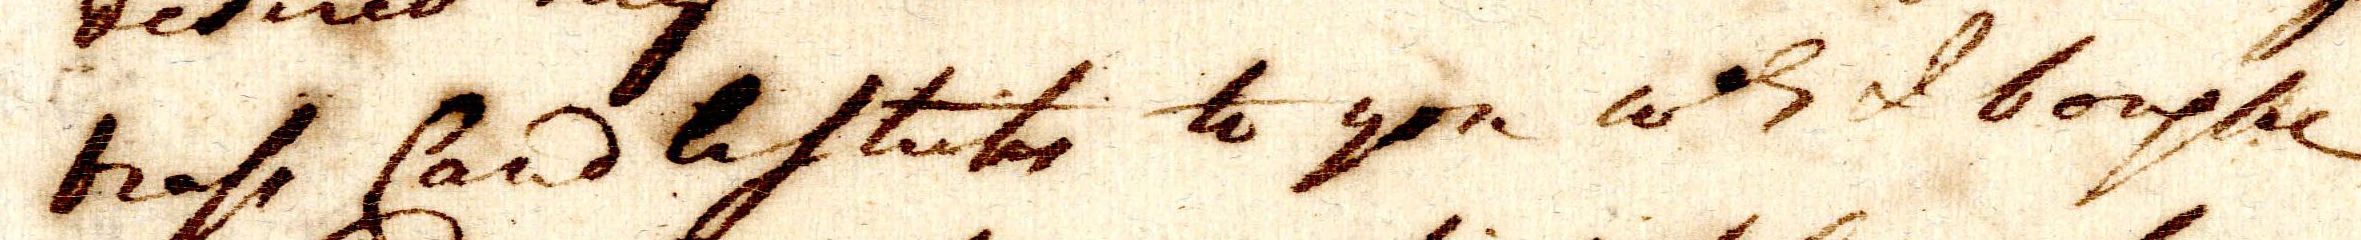brass Candlesticks to you w^ch I bought
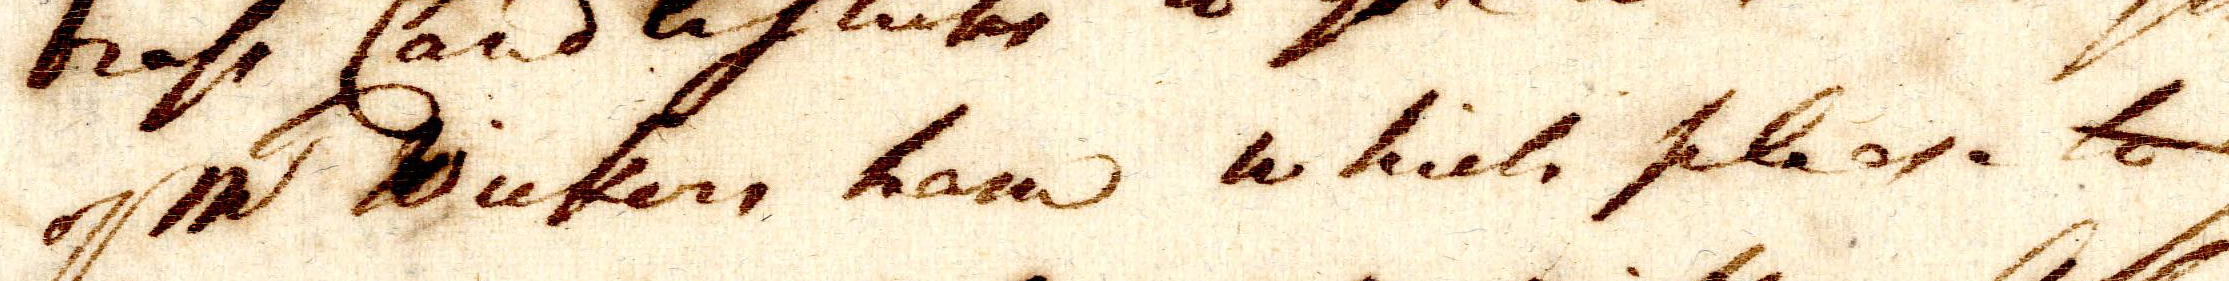of M Dickers have which please to
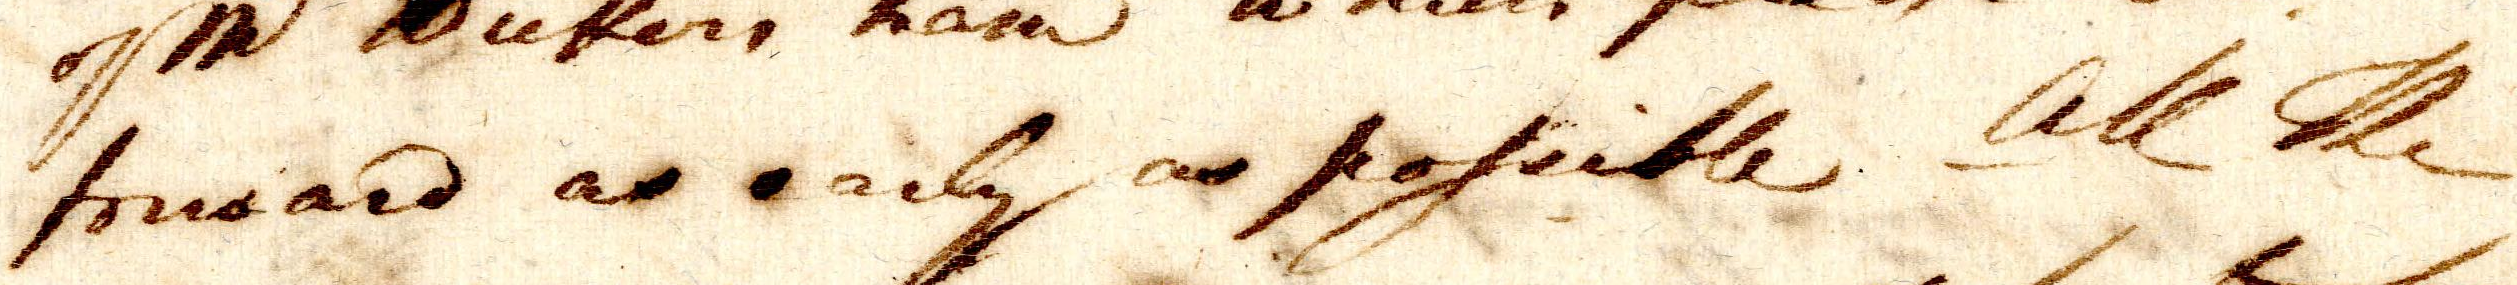forward as early as possible. All the
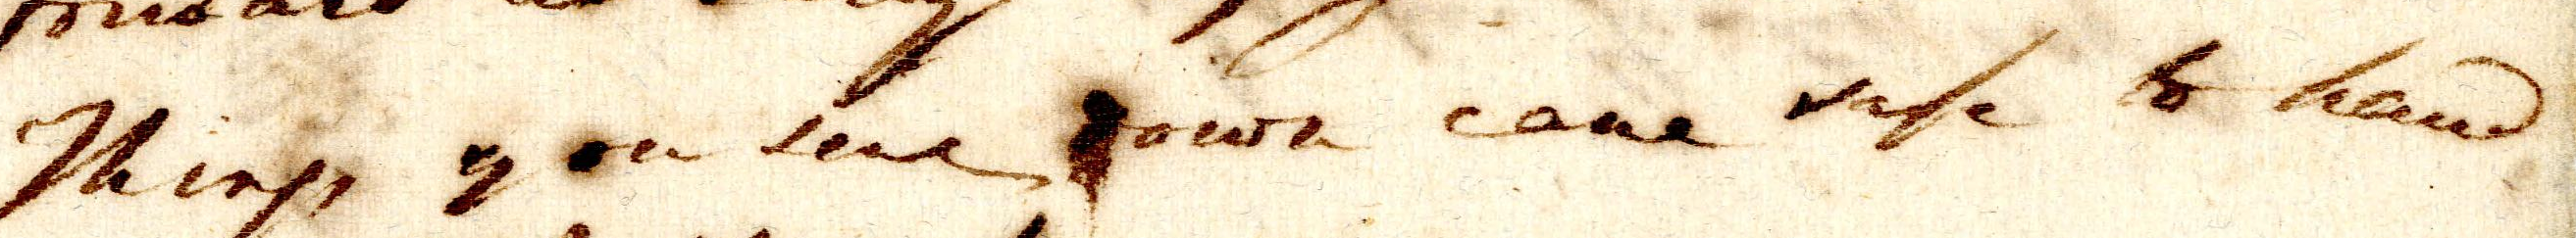things you sent down came safe to here
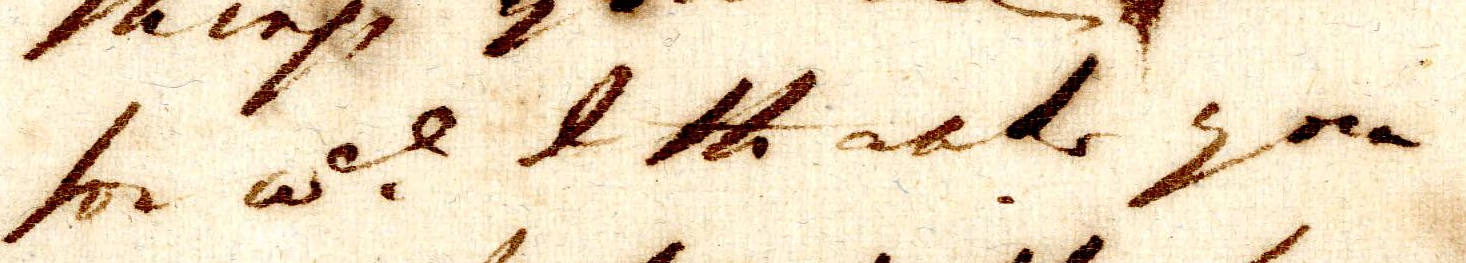for w^ch. I thank you
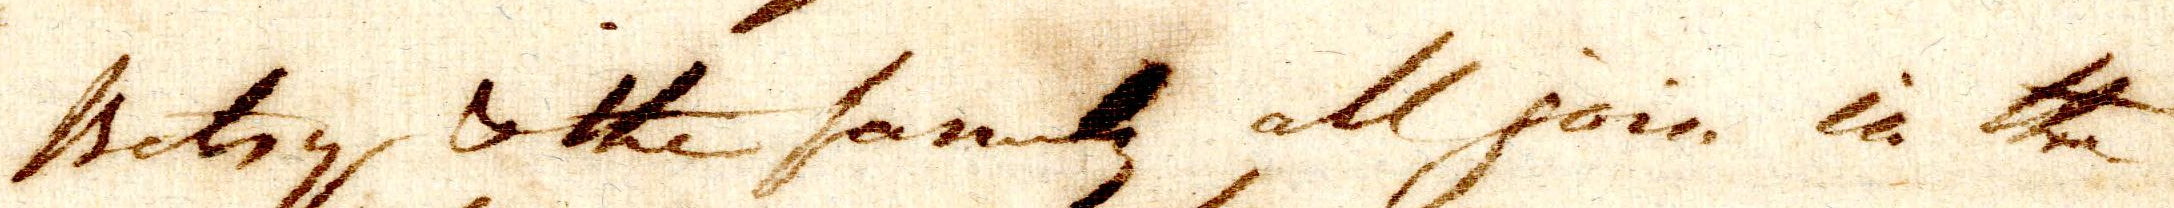Betsy & the family all join in the
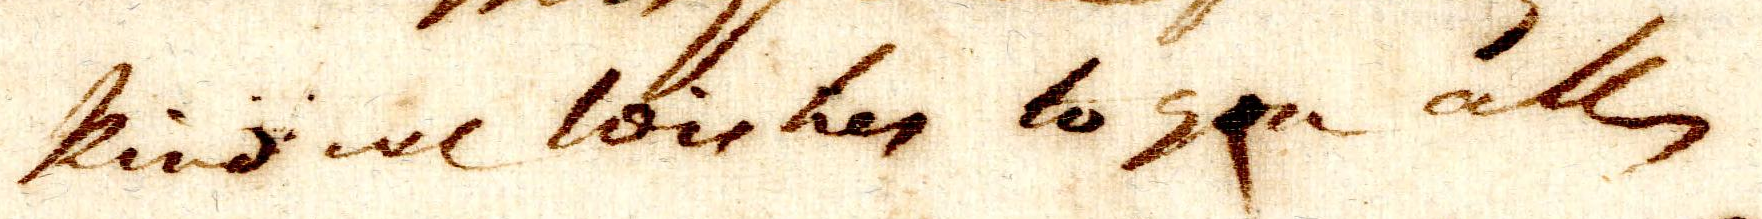kindest Wishes to you all
